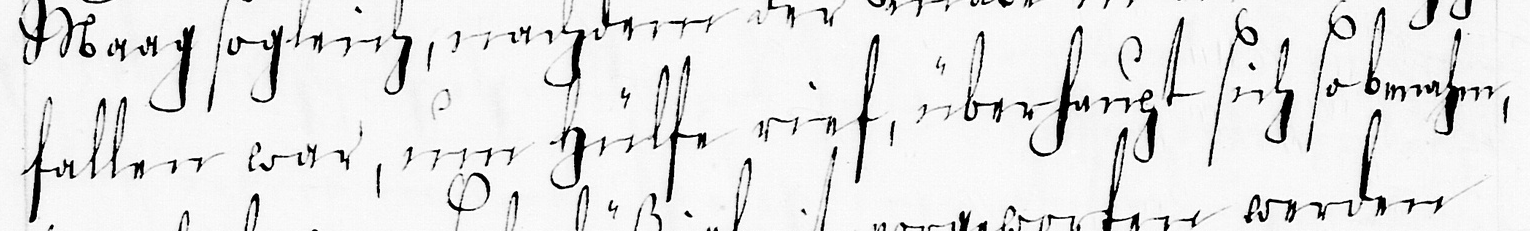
fallen war, um Hülfe rief, überhaupt sich so bena¬
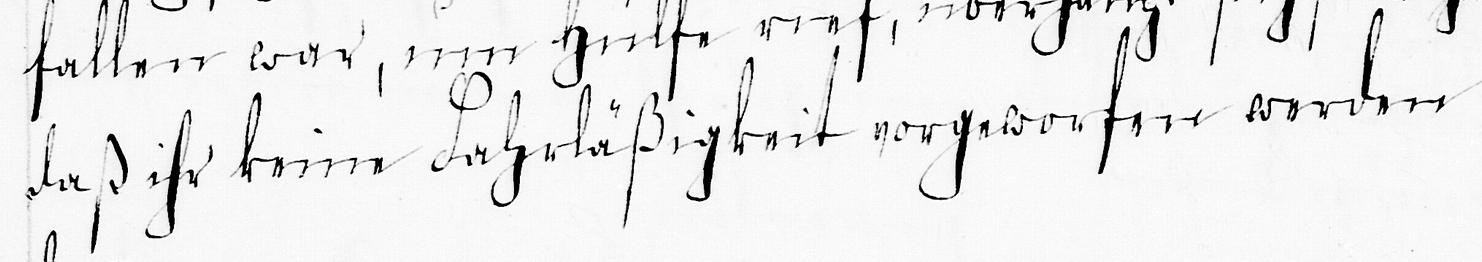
daß ihr keine Fahrläßigkeit vorgeworfen werden
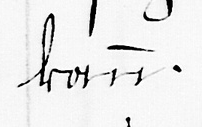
kann.
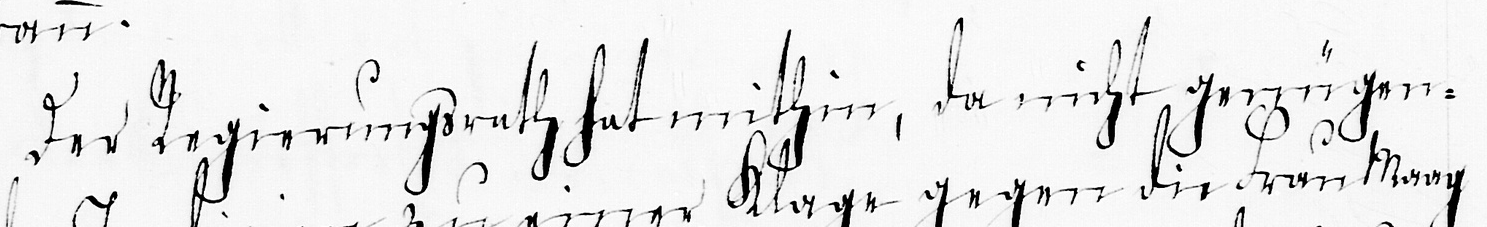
Der Regierungsrath hat mithin, da nicht genügen¬
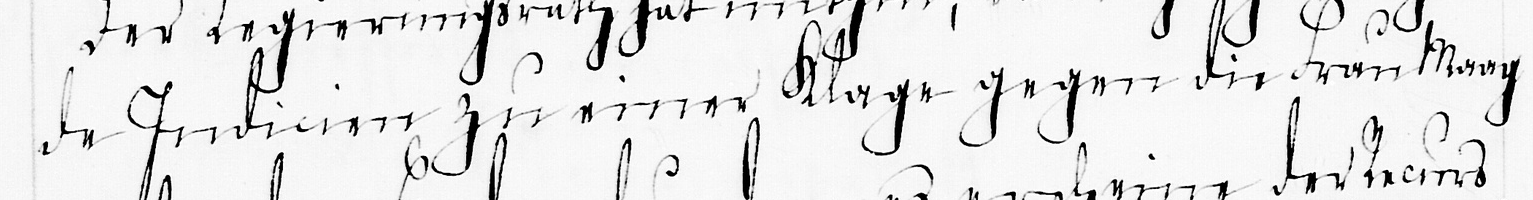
de Indicien zu einer Klage gegen die Frau Maag
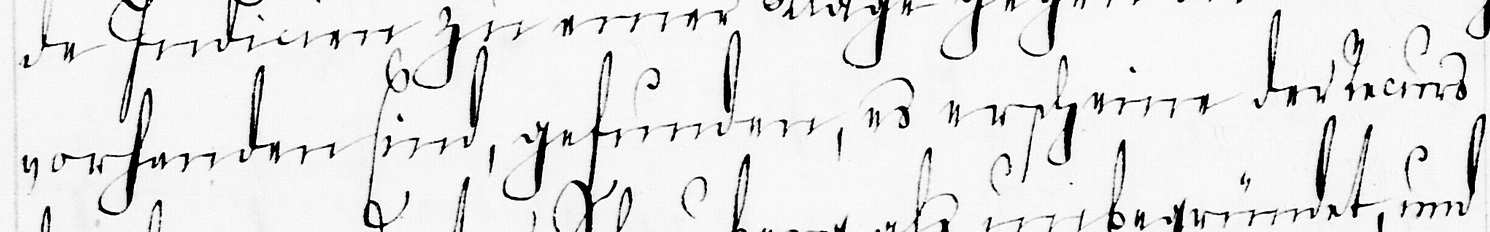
vorhanden sind, gefunden, es erscheine der Recurs
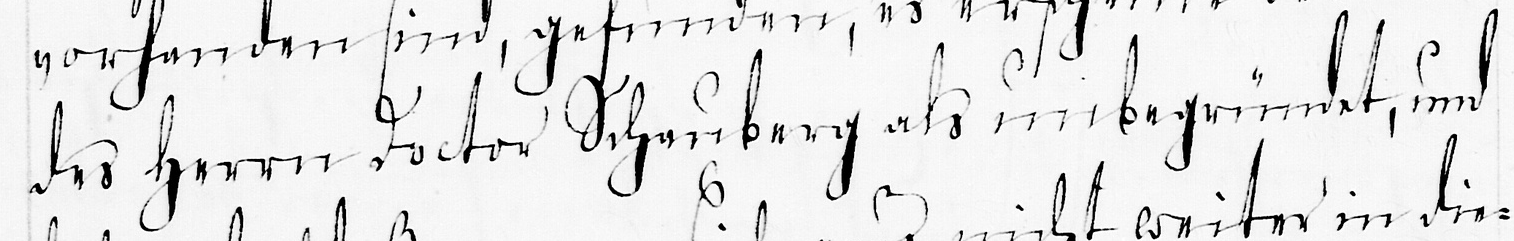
des Herrn Doctor Schauberg als unbegründet, und
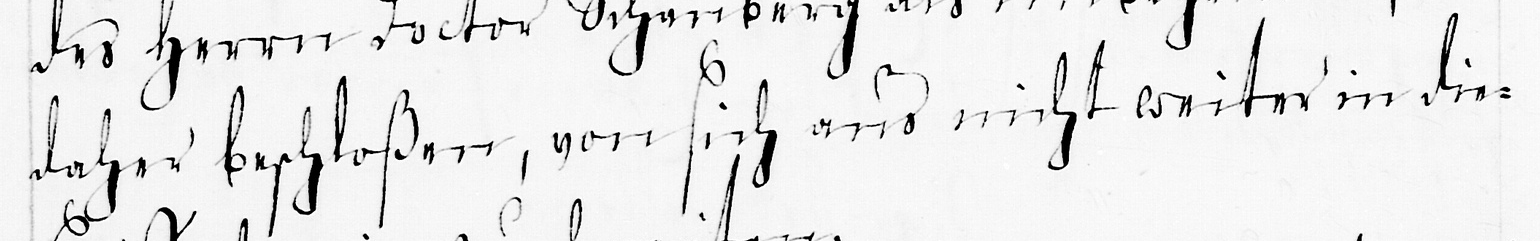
daher beschloßen, von sich aus nicht weiter in die¬
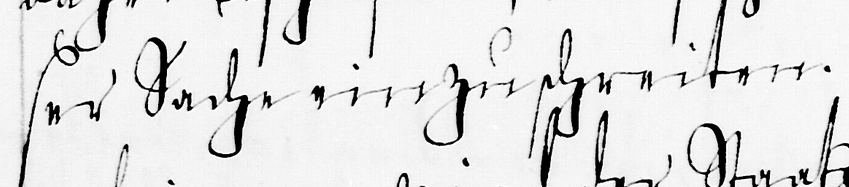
ser Sache einzuschreiten.
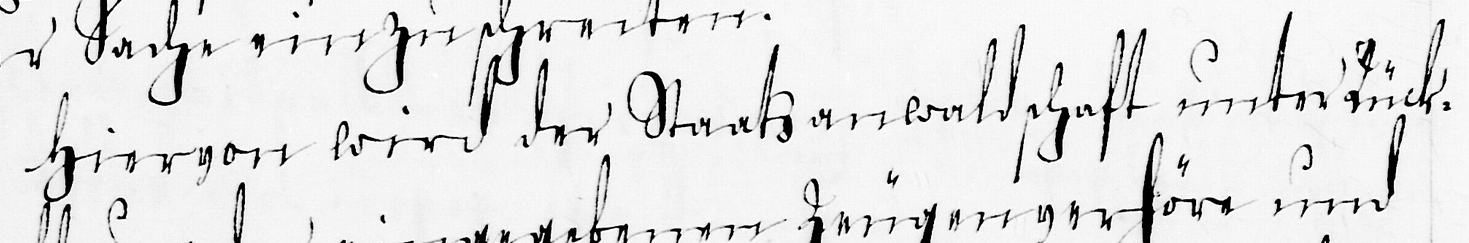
Hiervon wird der Staatsanwaldschaft unter Rück¬
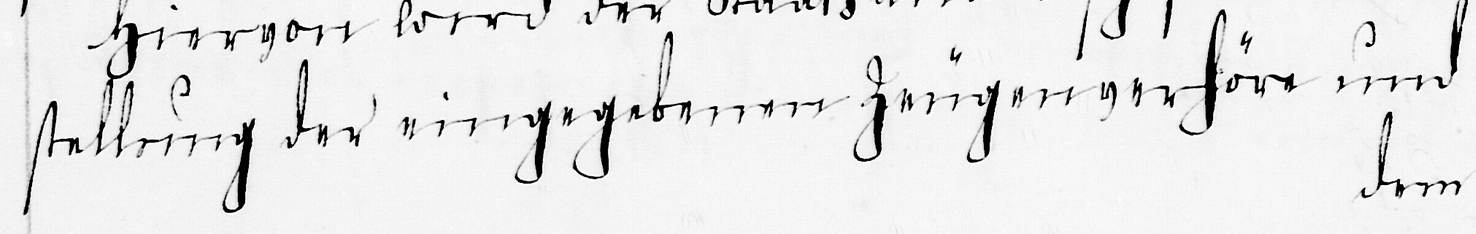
stellung der eingegebenen Zeugenverhöre und
